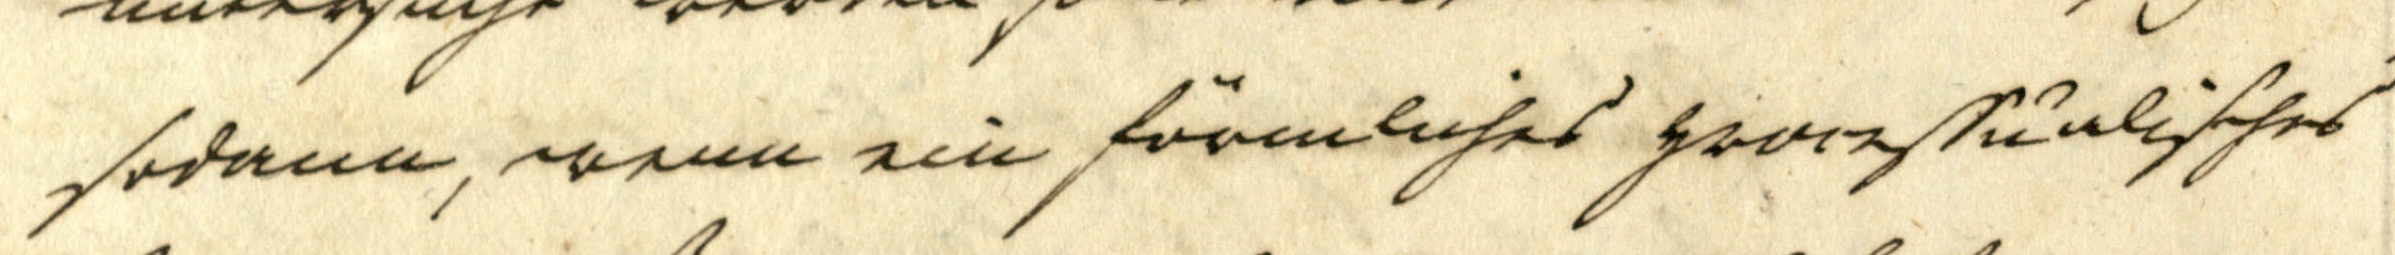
sodann, wenn ein förmliches processualisches
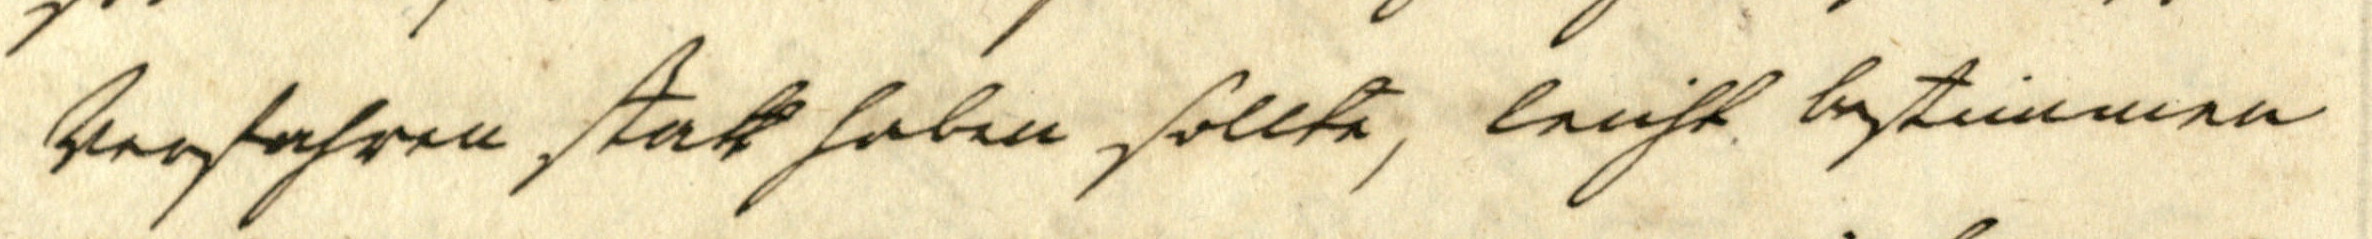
Verfahren statt haben sollte, leicht bestimmen
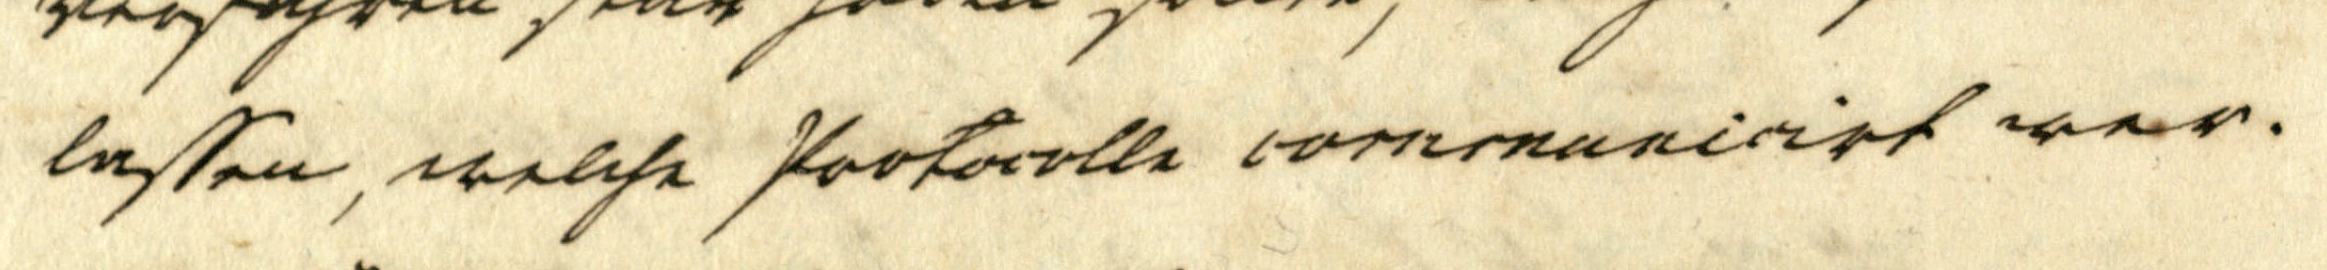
lassen, welche Protocolle communicirt wer¬
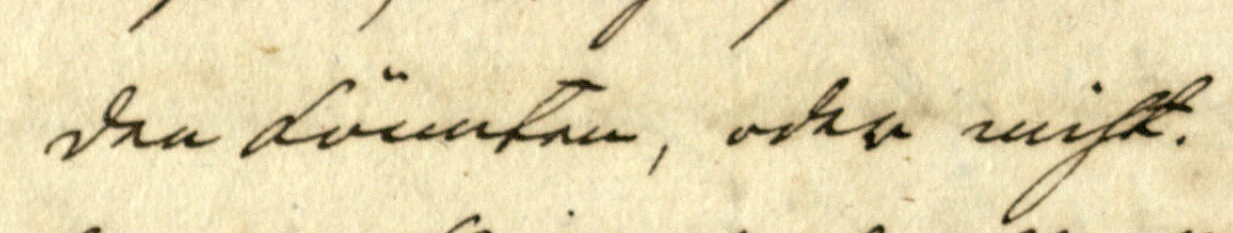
den könnten, oder nicht.
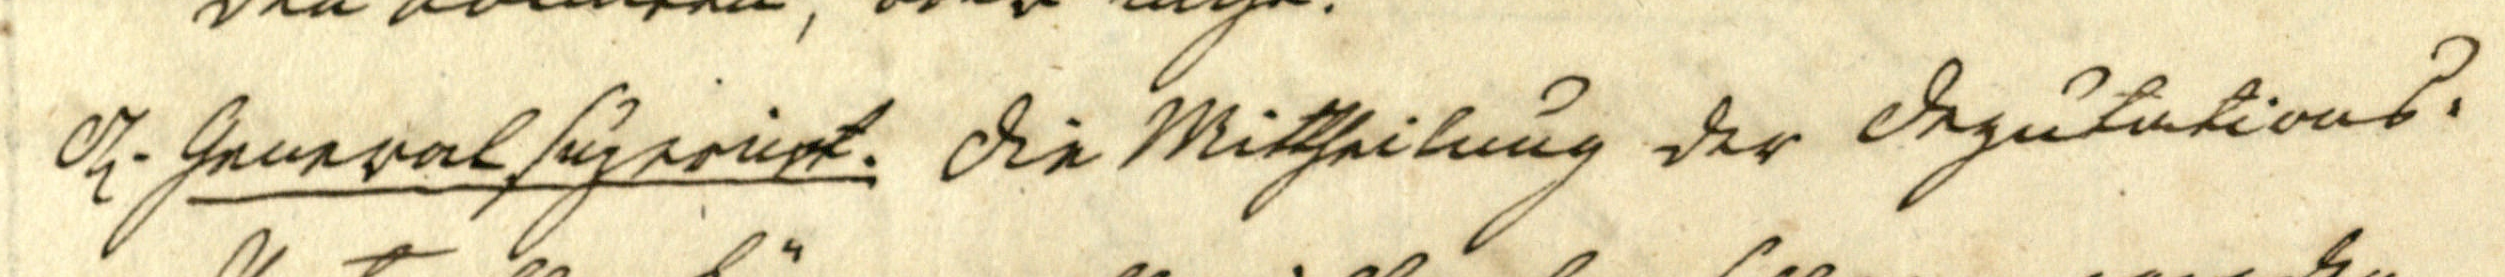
dh. Generalsuperint. Die Mittheilung der Deputations¬
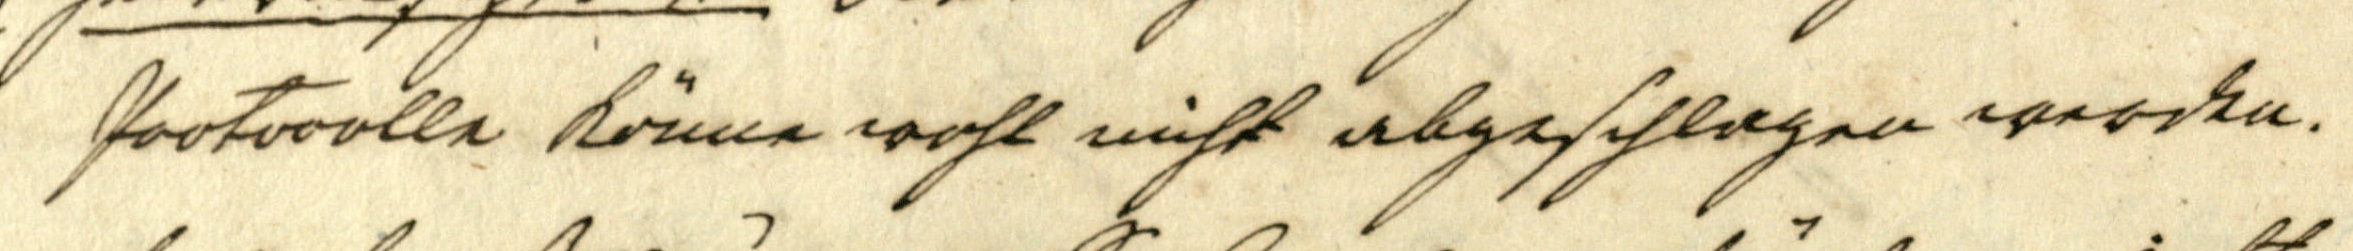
Protocolle könne wohl nicht abgeschlagen werden.
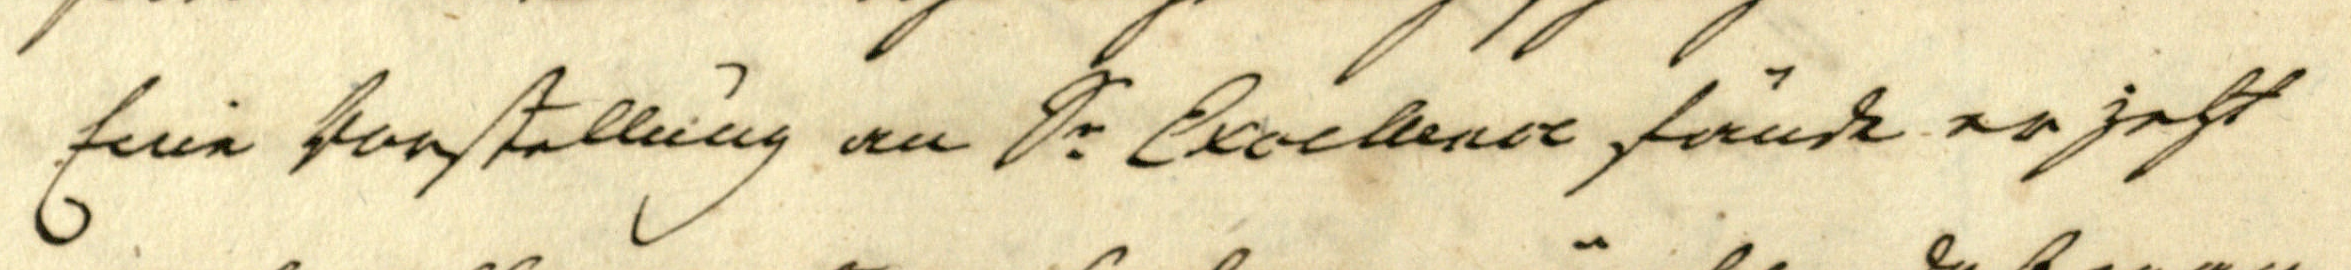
Eine Vorstellung an Sr Excellence fände er jetzt
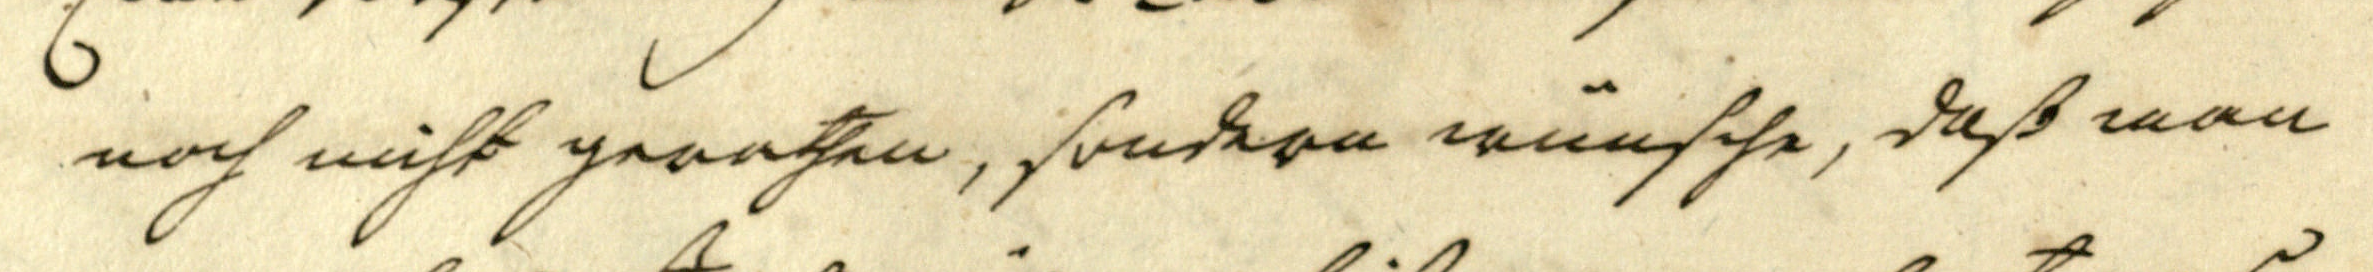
noch nicht gerathen, sondern wünsche, daß man
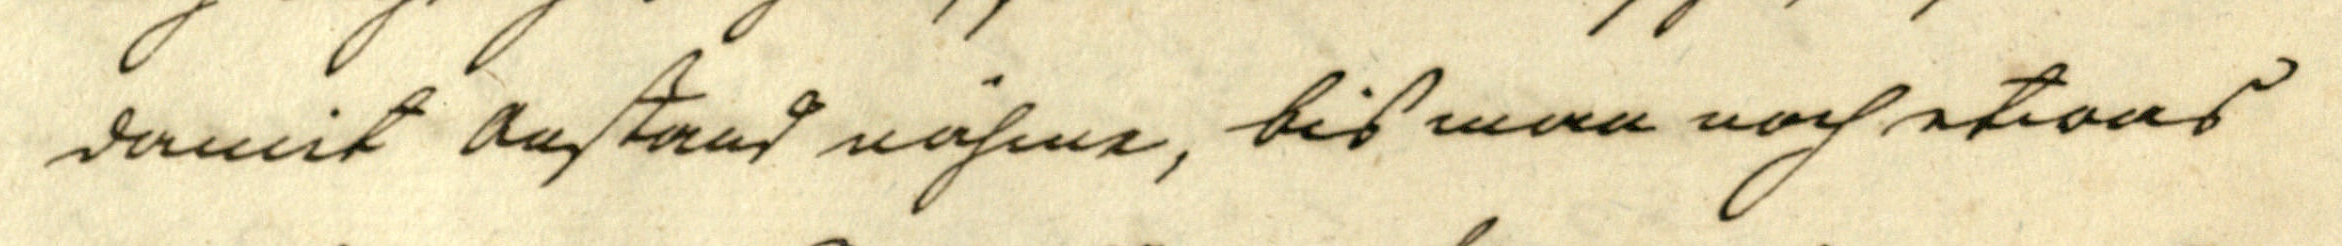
damit Anstand nähme, bis man noch etwas
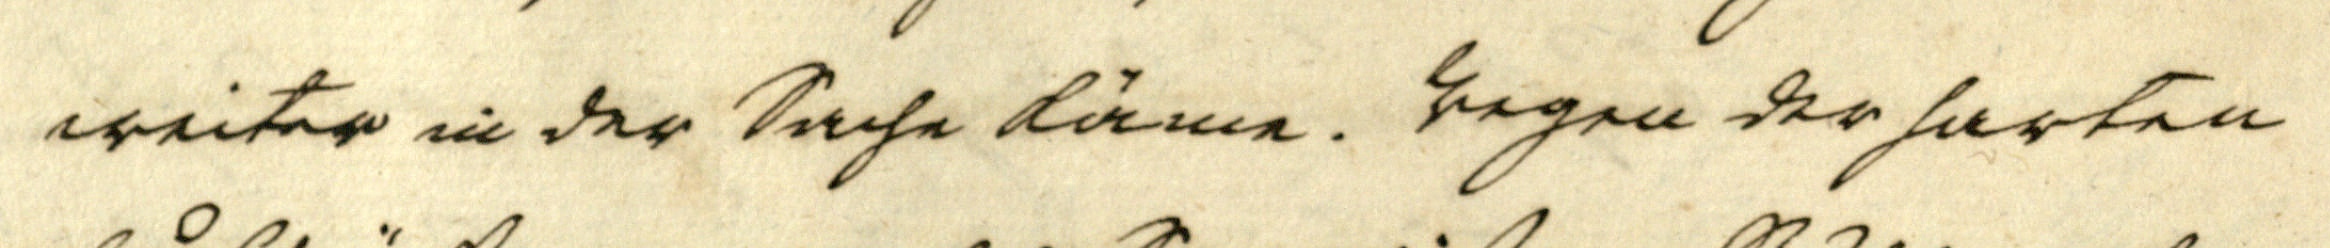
weiter in der Sache käme. Wegen der harten
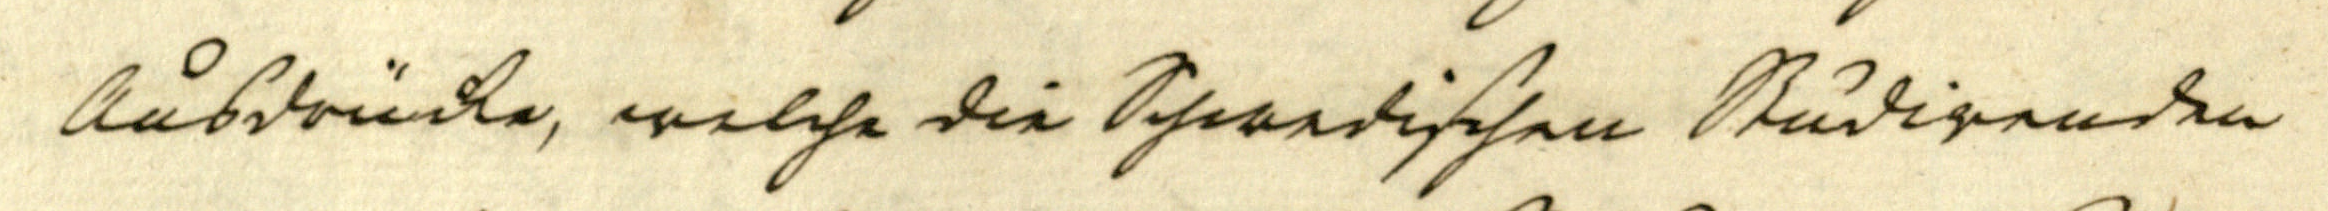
Ausdrücke, welche die Schwedischen Studirenden
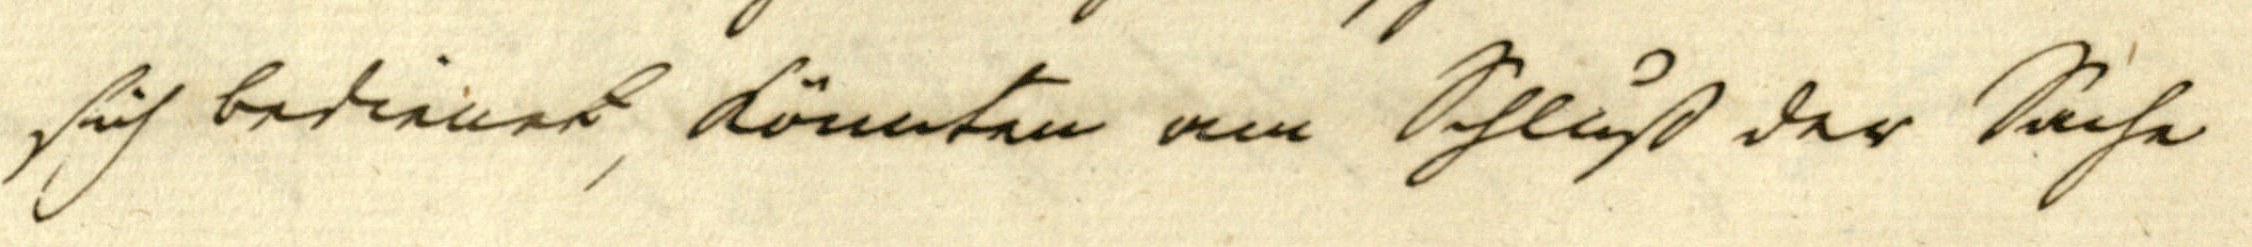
sich bedienet, könnten am Schluß der Sache
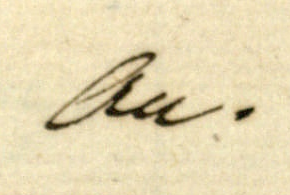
an-
